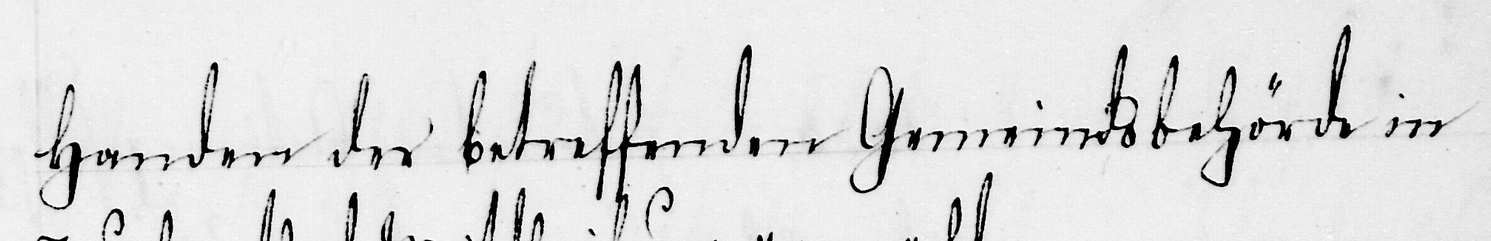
Handen der betreffenden Gemeindsbehörde in
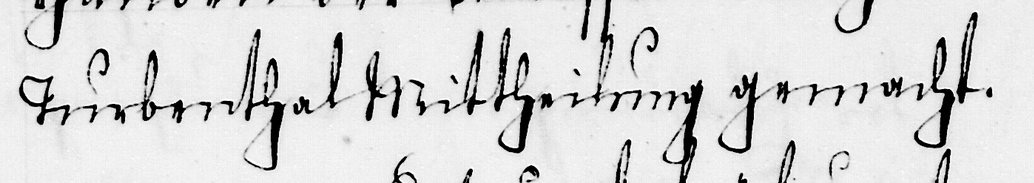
Turbenthal Mittheilung gemacht.
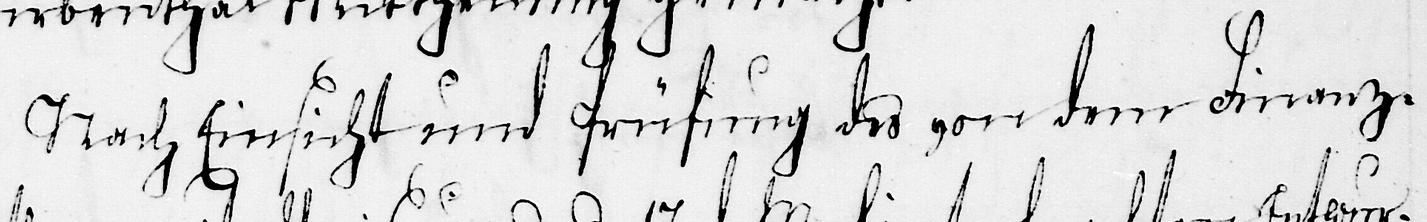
Nach Einsicht und Prüfung des von dem Finanz¬
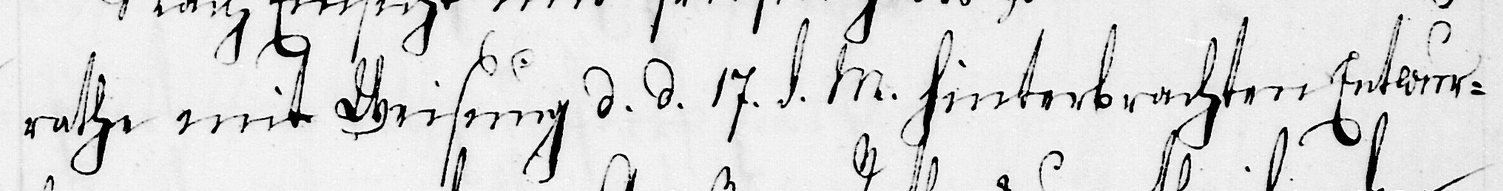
rathe mit Weisung d. d. 17. d. M. hinterbrachten Entwur¬
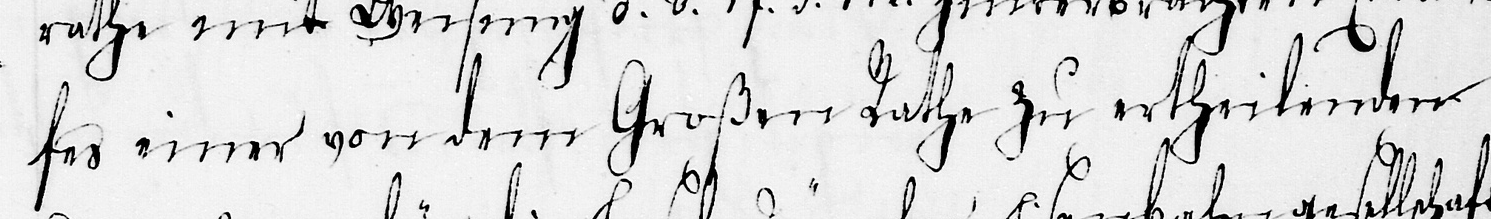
fes einer von dem Großen Rathe zu ertheilenden
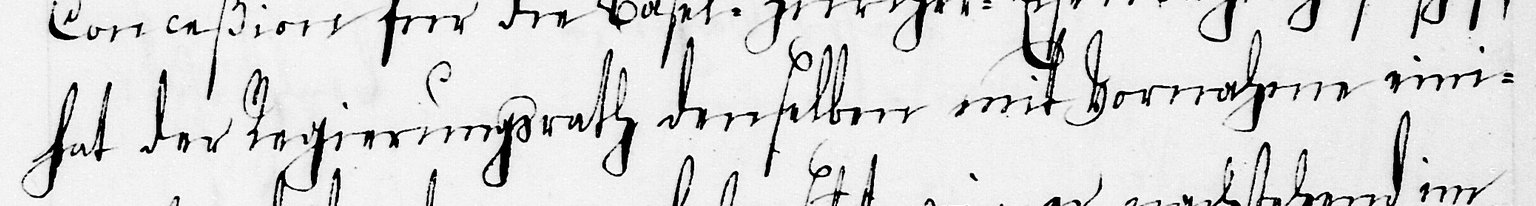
hat der Regierungsrath denselben mit Vornahme eini¬
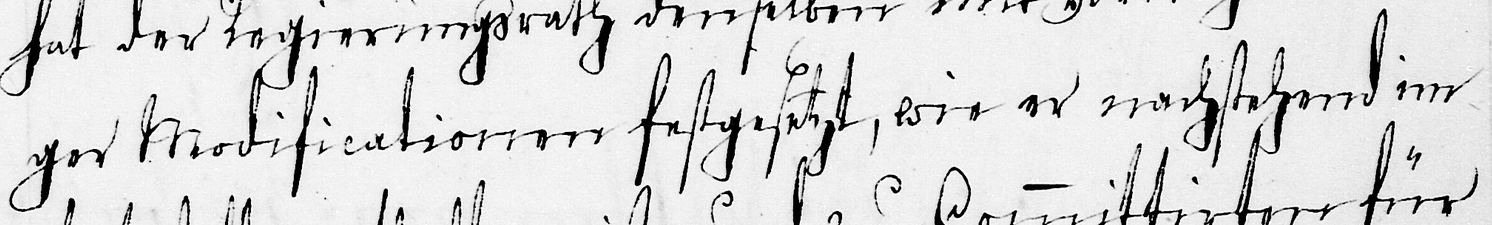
ger Modificationen festgesetzt, wie er nachstehend im
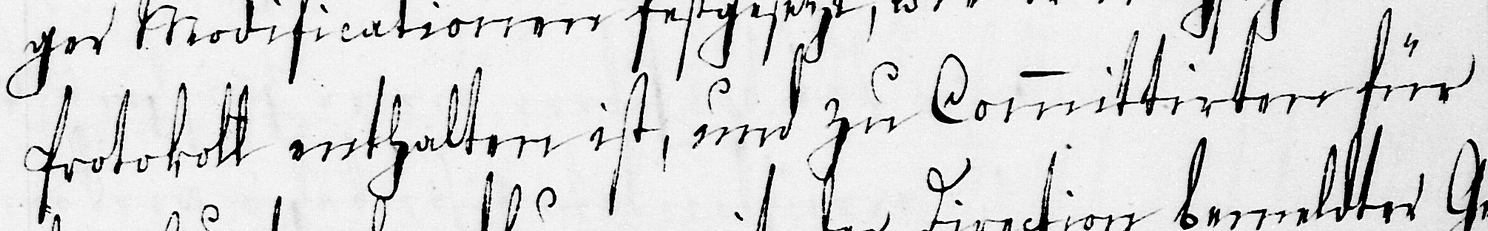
Protokoll enthalten ist, und zu Committirten für
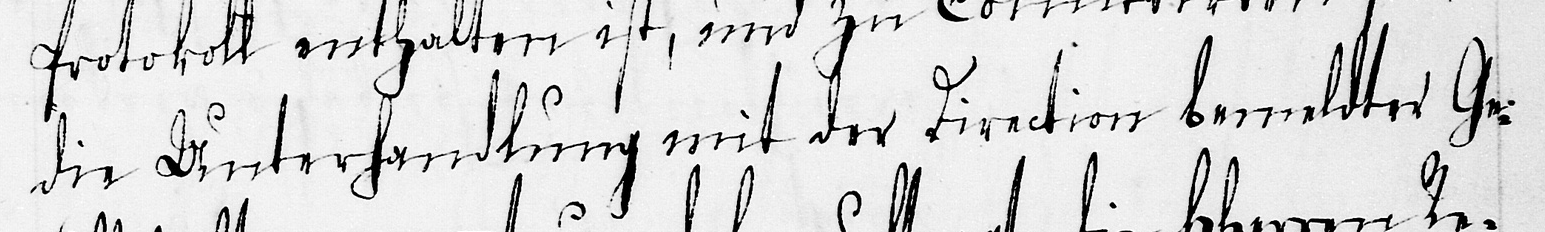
die Unterhandlung mit der Direction bemeldter Gese¬
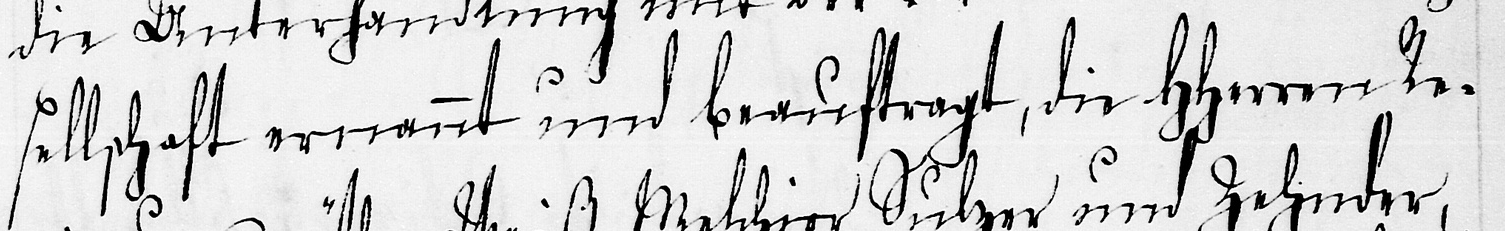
llschaft ernannt und beauftragt, die HHerren Re¬
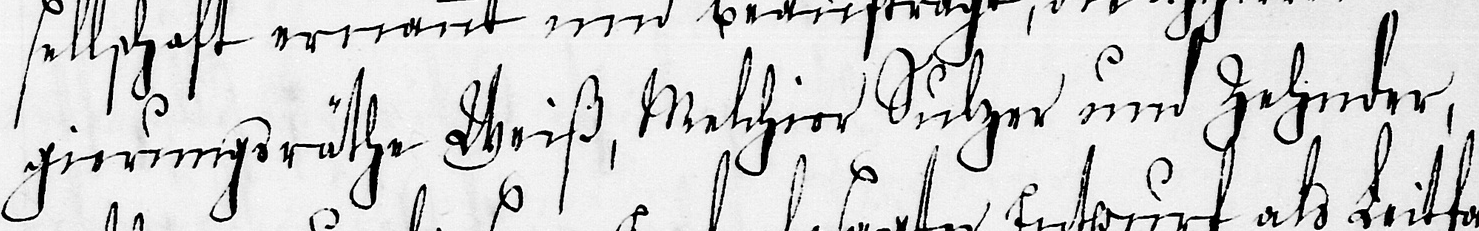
gierungsräthe Weiß, Melchior Sulzer und Zehnder,
